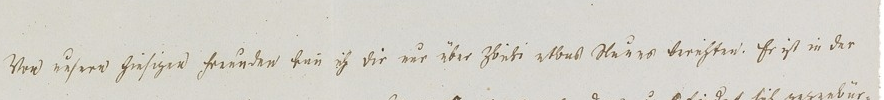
Von unsern hiesigen Freunden kann ich dir nur über Zwicki etwas Neues berichten. Er ist in der
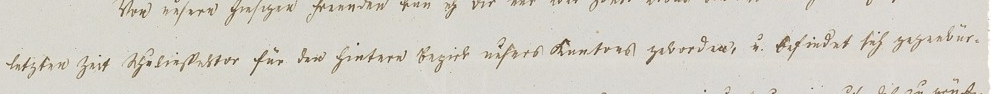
letzten Zeit Schulinspektor für den hintern Bezirk unsers Kantons geworden, u. befindet sich gegenwär-
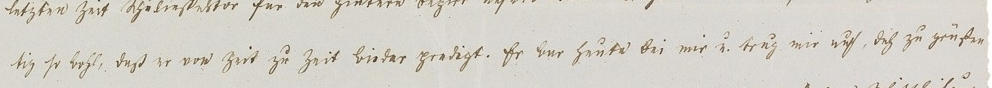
tig so wohl, daß er von Zeit zu Zeit wieder predigt. Er war heute bei mir u. trug mir auf, dich zu grüßen
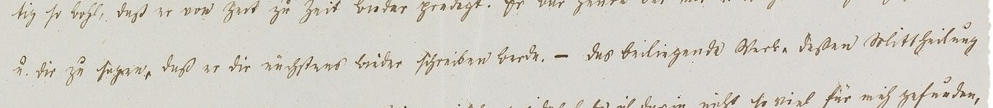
u. dir zu sagen, daß er dir nächstens wieder schreiben werde. – Das beiliegende Werk, deßen Mittheilung
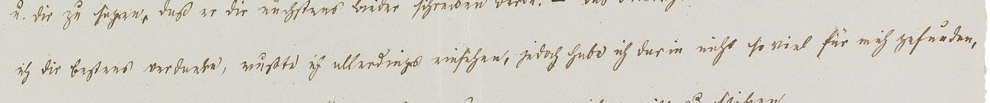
ich dir bestens verdanke, mußte ich allerdings einsehen, jedoch habe ich darin nicht so viel für mich gefunden,
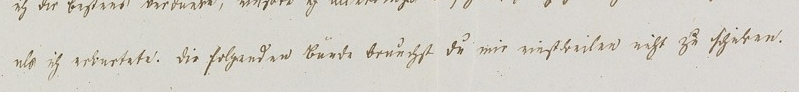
als ich erwartete. Die folgenden Bände brauchst du mir einstweilen nicht zu schicken.
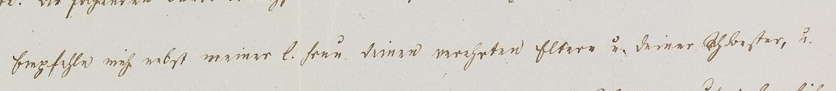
Empfehle mich nebst meiner l. Fraudeinen verehrten Eltern u. deiner Schwester, u.
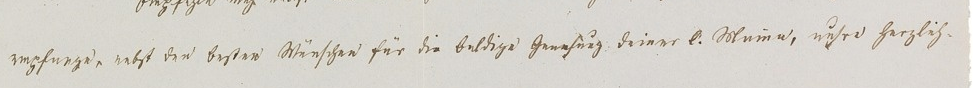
empfange, nebst den besten Wünschen für die baldige Genesung deiner l. Mamma, unsre herzlich-
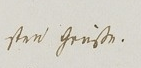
sten Grüße.
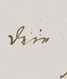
Dein
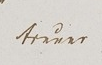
treuer
